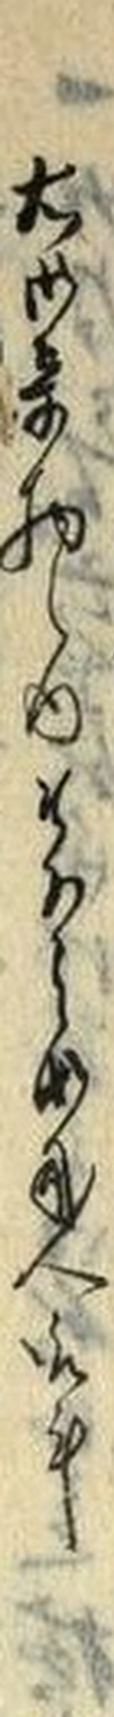右御寄物之内被下之御用人取計
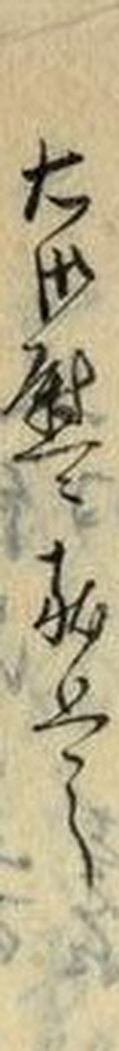右御慰ニ献上之
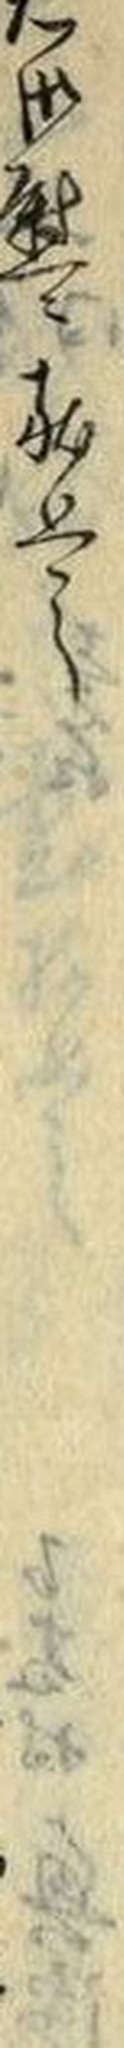右御慰ニ献上之
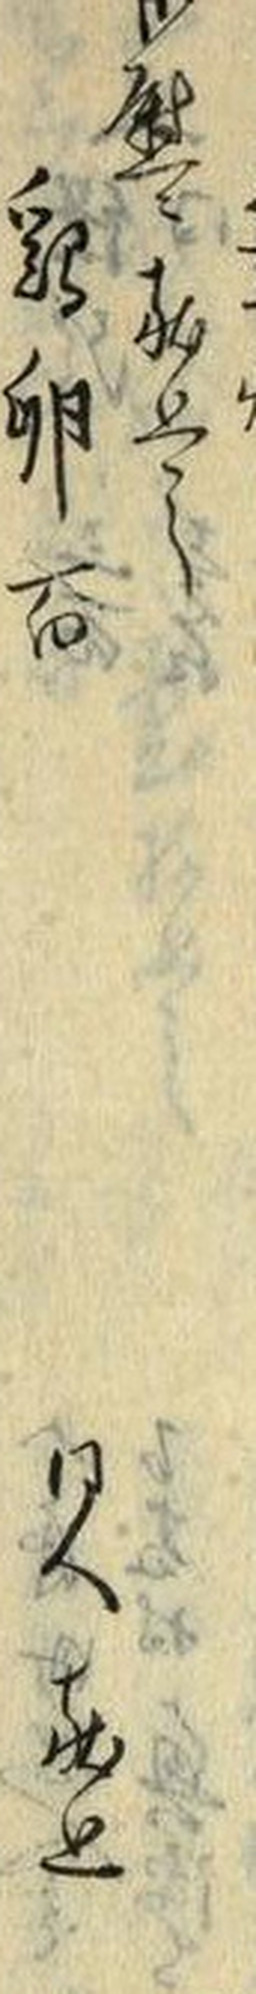鶏卵百同人献上

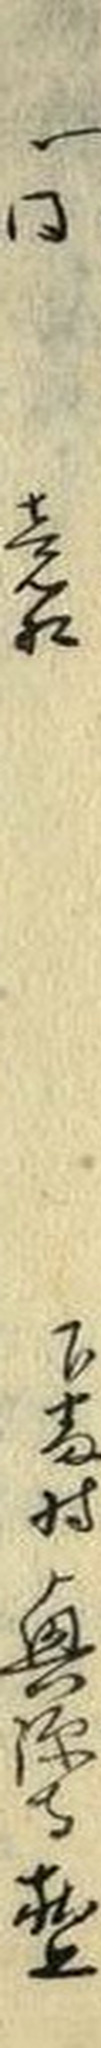同壱箱下番村興源寺献上
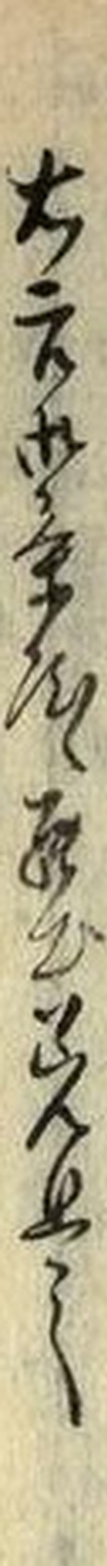右二日御茶屋へ罷出差上之
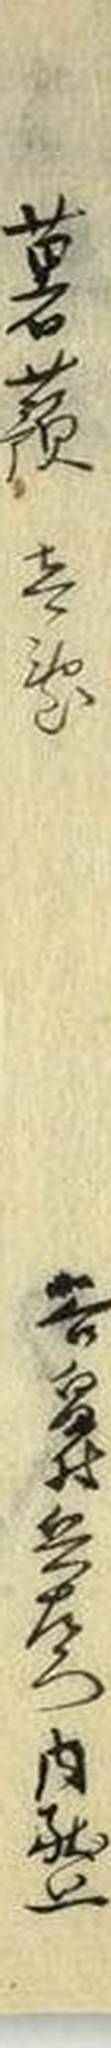薯蕷壱台谷畠村兵左衛門内献上
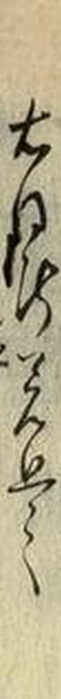右同断差上之
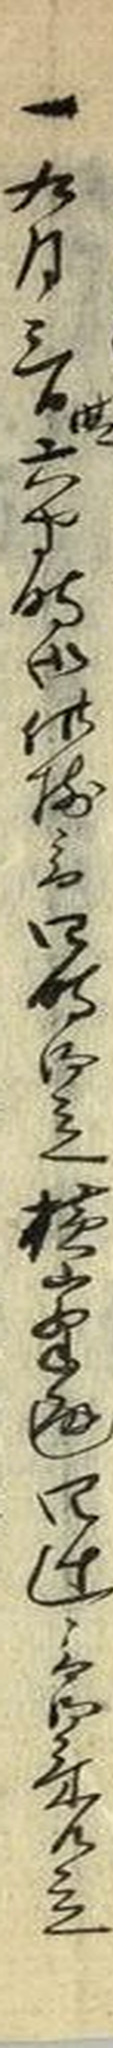一九月三日晴六半時御供揃ニ而四時御立横峯通四辻ニ而御床几立
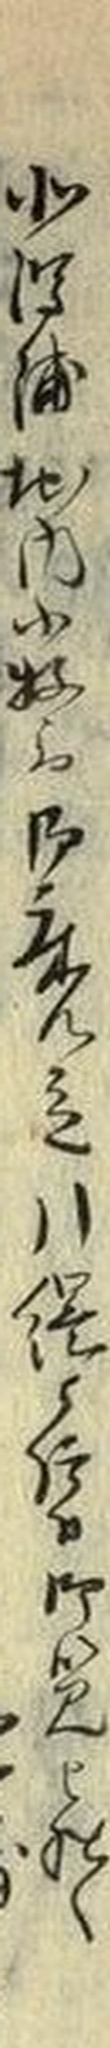北潟浦地内小牧ニ而御床几立引網被仰付御覧被遊候
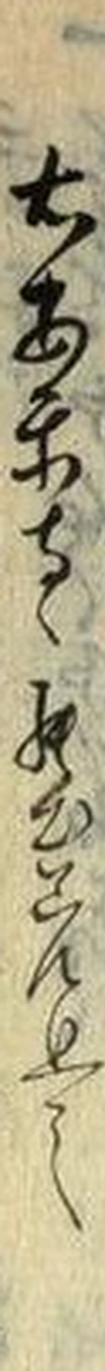右安楽寺へ罷出差上之
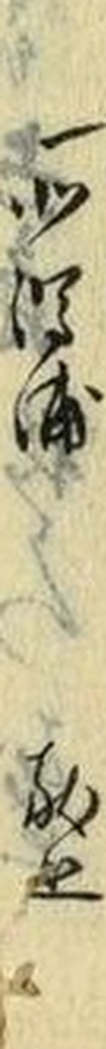北潟浦献上
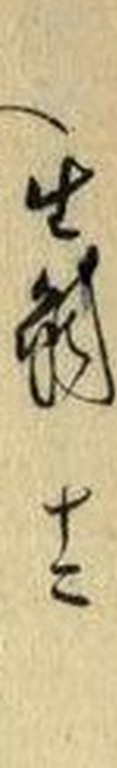生鯛十二
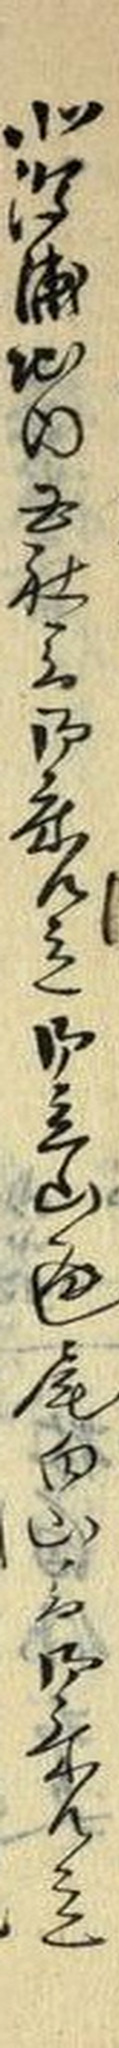北潟浦地内五社ニ而御床几立御立山通尾白山ニ而御床几立
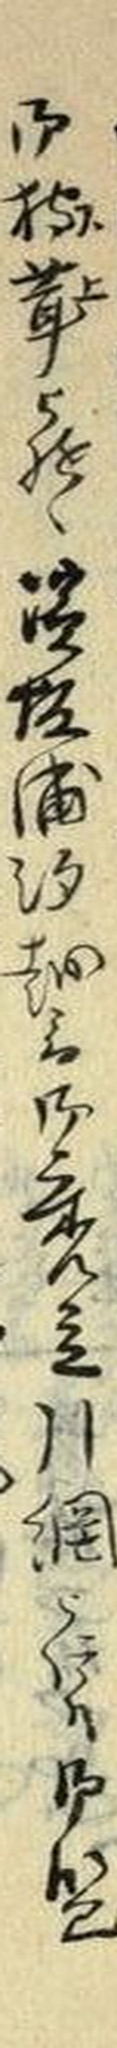御狩茸被遊候浜坂浦汐越ニ而御床几立引網被仰付御覧
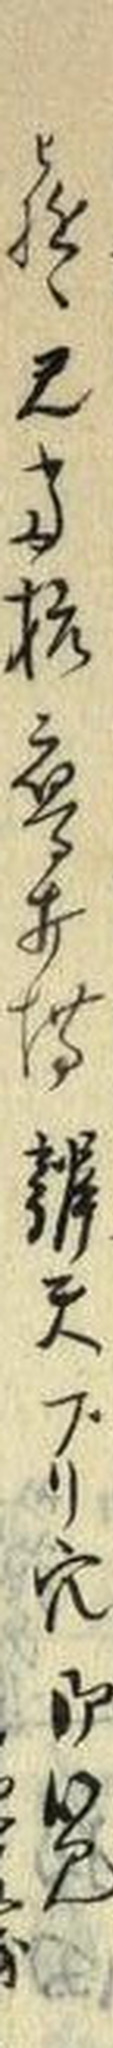被遊候見当杭鷹打場弁天ブリ穴御覧
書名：少傅日録抄（斉承付側向頭取日記、在国）
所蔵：福井県文書館 Fukui Prefectural Archives
